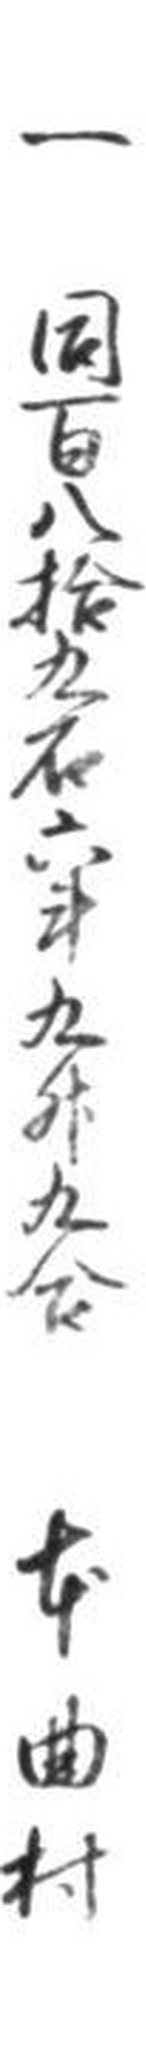一同百八拾九石六斗九升九合本曲村
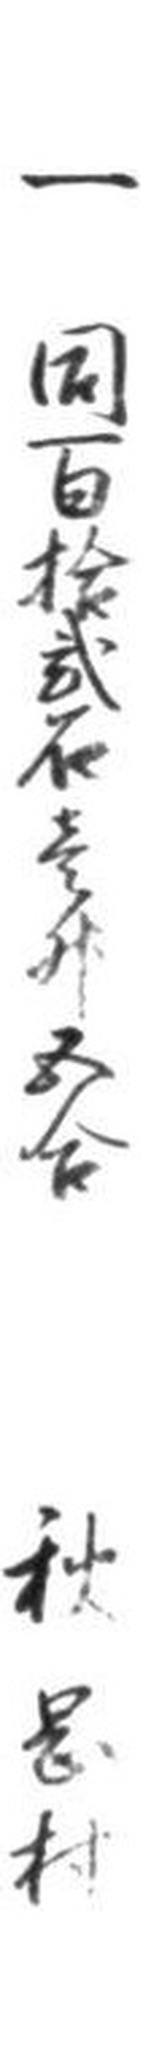一同百拾弐石壱升五合秋岡村
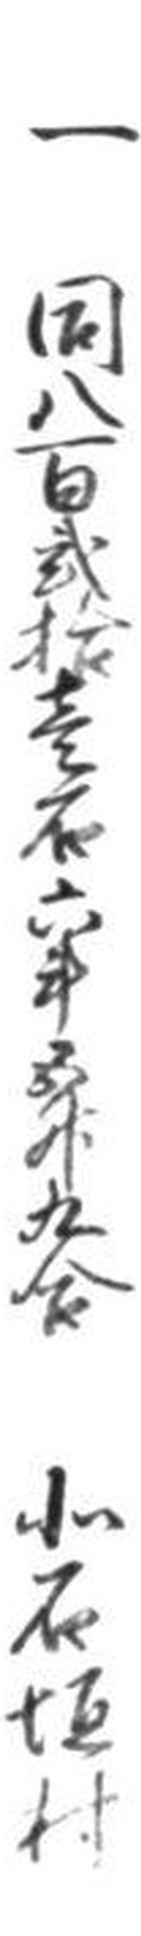一同八百弐拾壱石六斗五升九合北石垣村
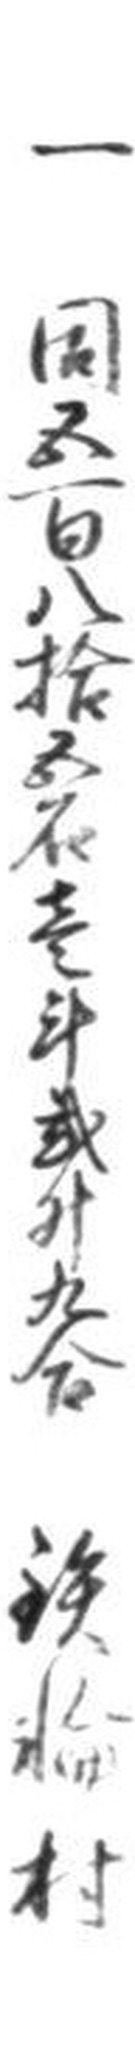一同五百八拾五石壱斗弐升九合鉄輪村
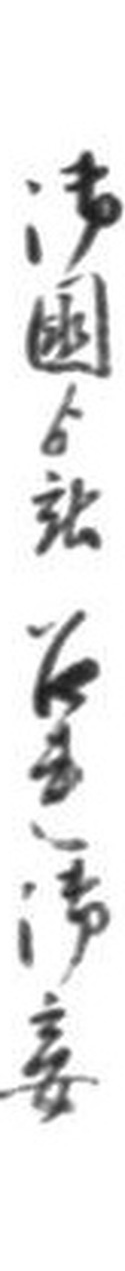御国ゟ被召連御妾
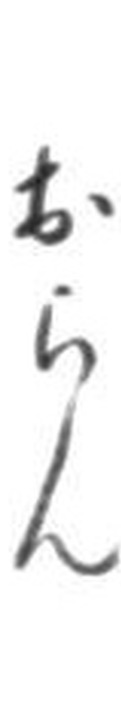おらん
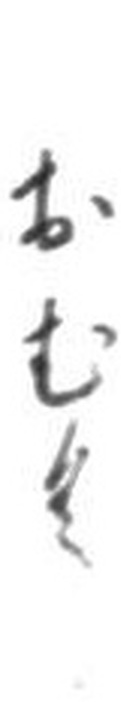おむく
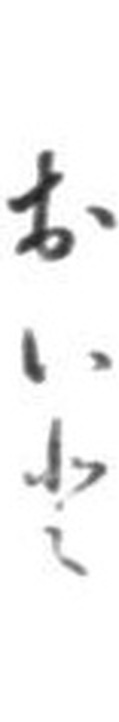おいと
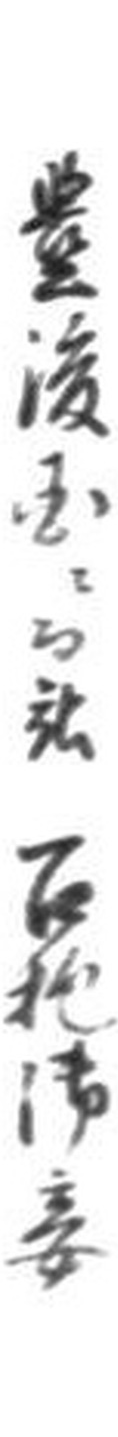豊後国ニ而被召抱御妾
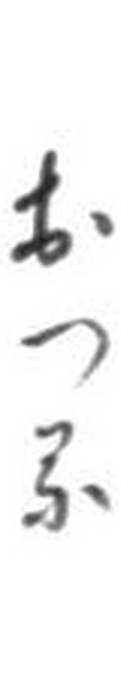おつる
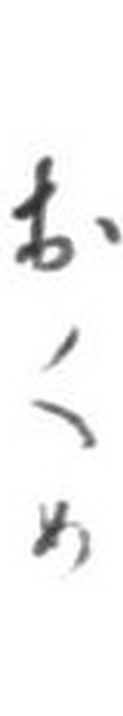おくめ
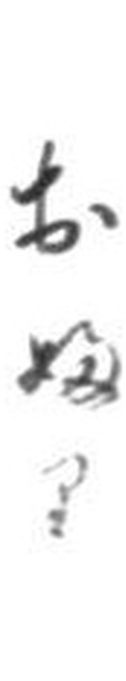おふり
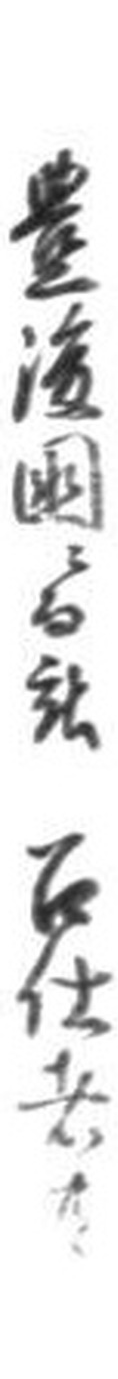豊後国ニ而被召仕者共

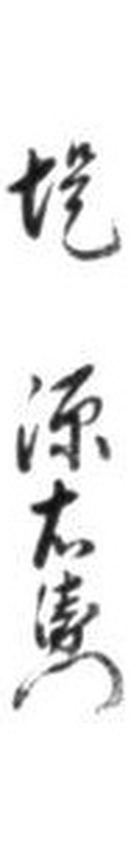堤源右衛門
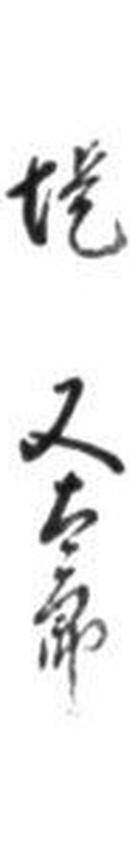堤又太郎
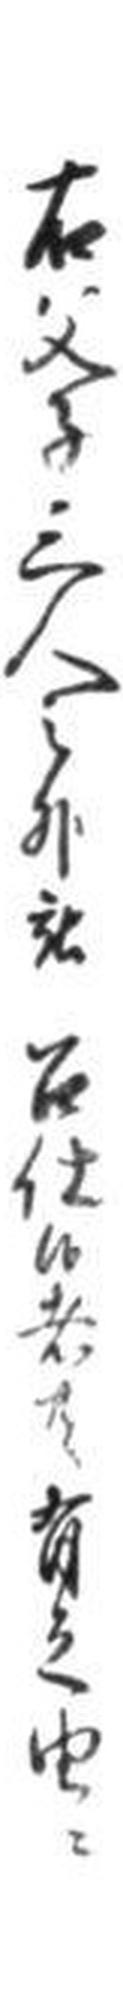右父子三人之外被召仕候者共有之由ニ
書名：家譜 二 忠直公 従文禄四年到慶安四年
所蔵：福井県文書館 Fukui Prefectural Archives
